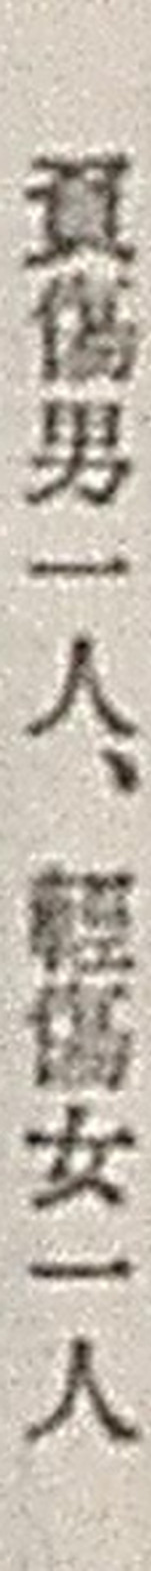負傷男一人、軽傷女一人
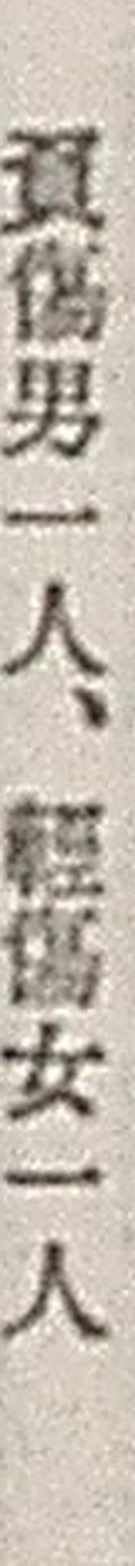負傷男一人、軽傷女一人
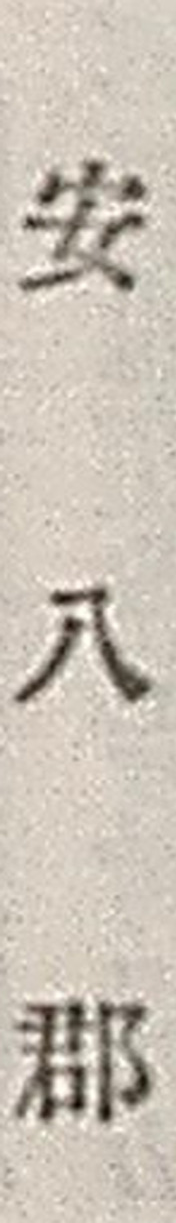安八郡
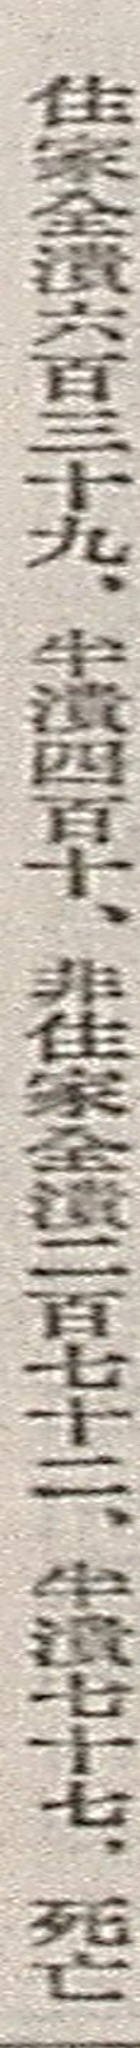住家全潰六百三十九、半潰四百十、非住家全潰二百七十二、半潰七十七死亡
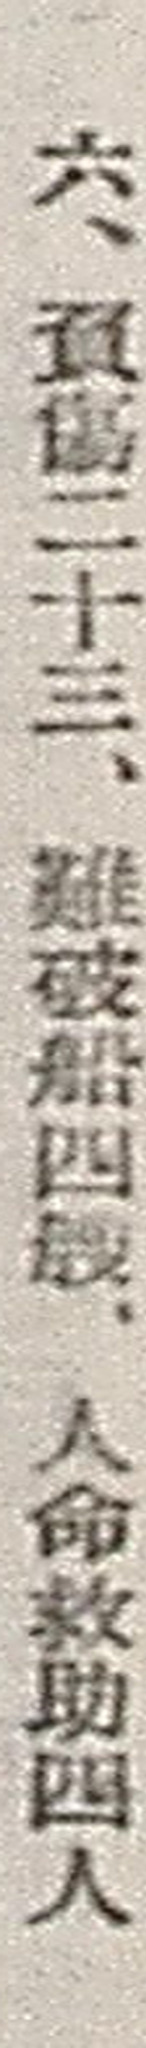六、負傷二十三、難破船四艘、人命救助四人
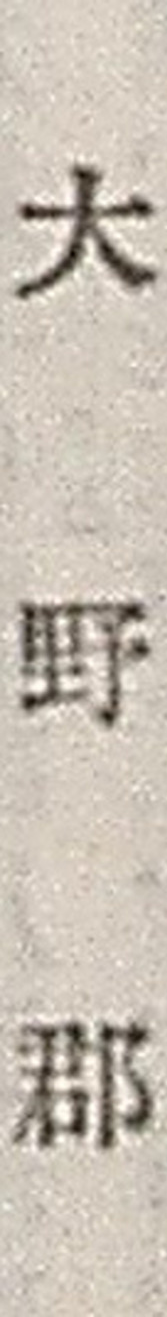大野郡
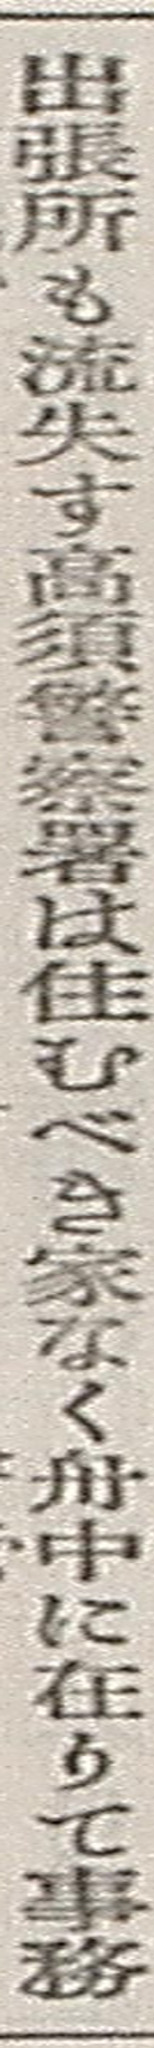出張所も流失す高須警察署は住むべき家なく舟中に在りて事務
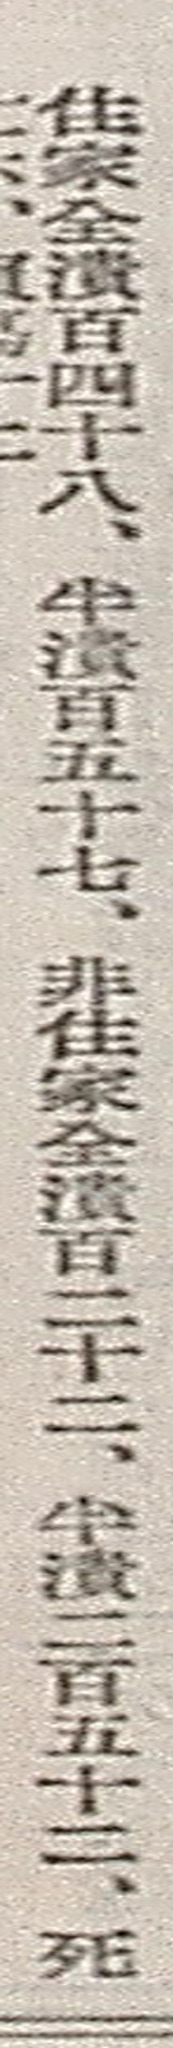住家全潰百四十八、半潰百五十七、非住家全潰百二十二、半潰二百五十二、死
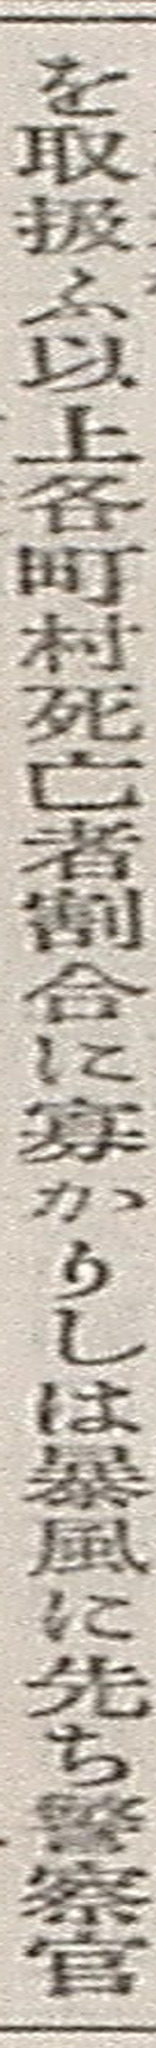を取扱ふ以上各町村死亡者割合に寡かりしは暴風に先ち警察官
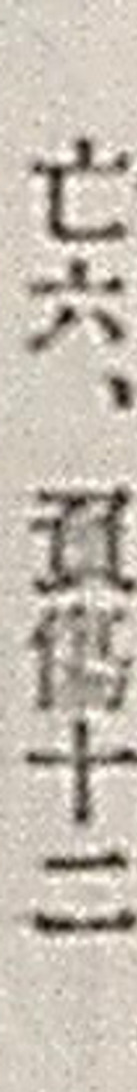亡六、負傷十二
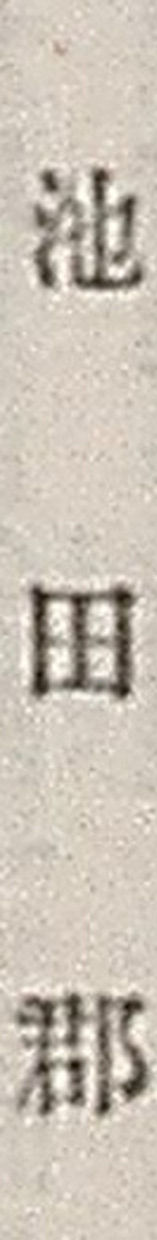池田郡
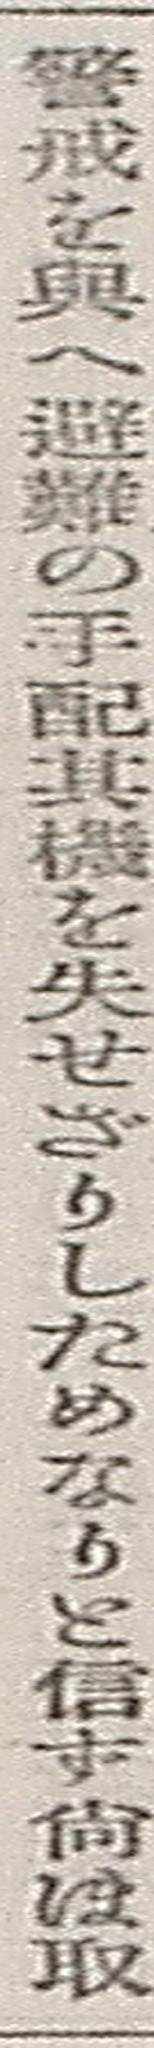警戒を與へ避難の手配其機を失せざりしためなりと信ず尚ほ取
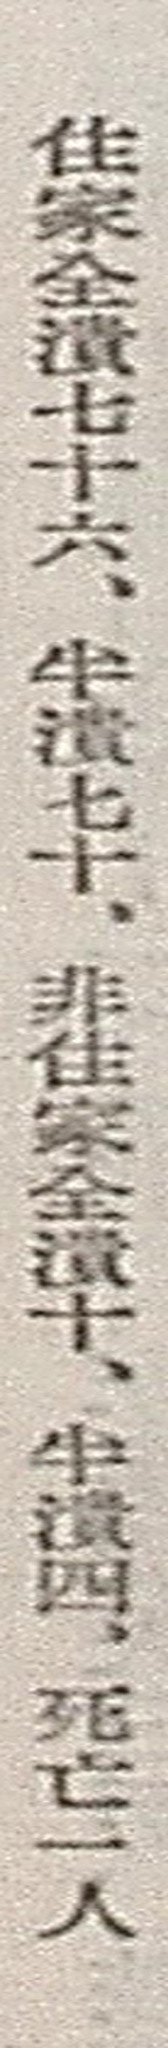住家全潰七十六、半潰七十、非住家全潰十、半潰四、死亡一人
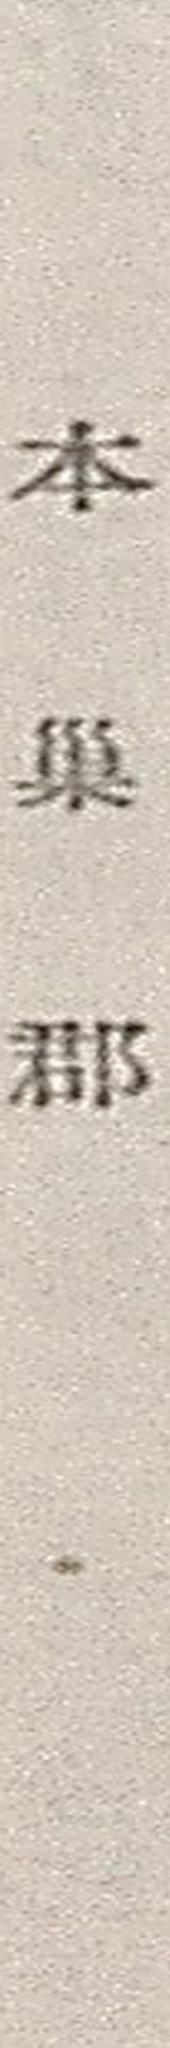本巣郡
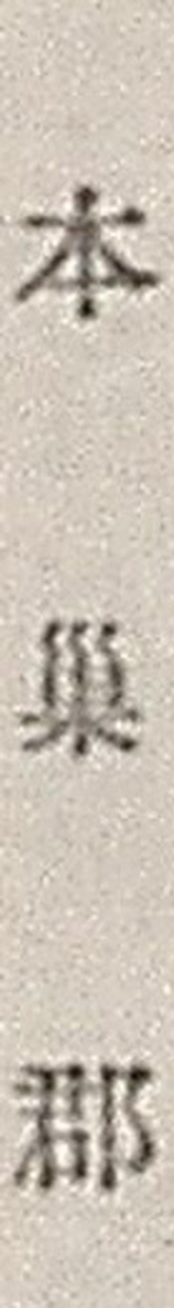本巣郡
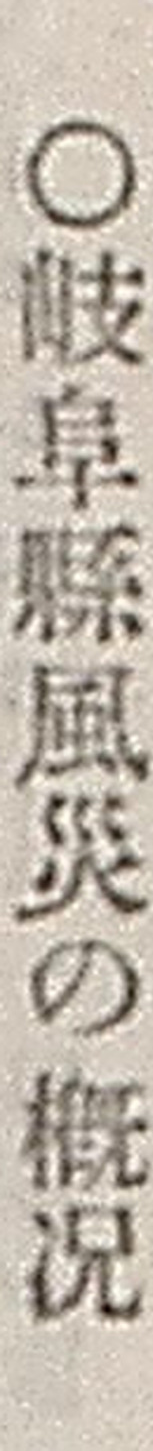◯岐阜縣風災の概況
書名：風俗畫報臨時増刊第百二十六號　洪水被害録（中）
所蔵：東京大学地震研究所図書室 Earthquake Research Institute Library, The University of Tokyo, JAPAN
